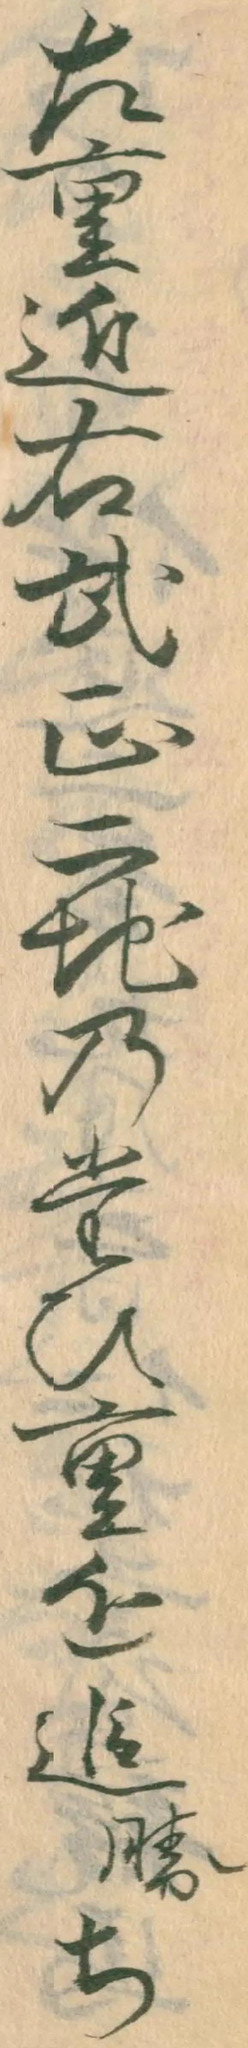左重近右武正二地のたひ重近追勝ち
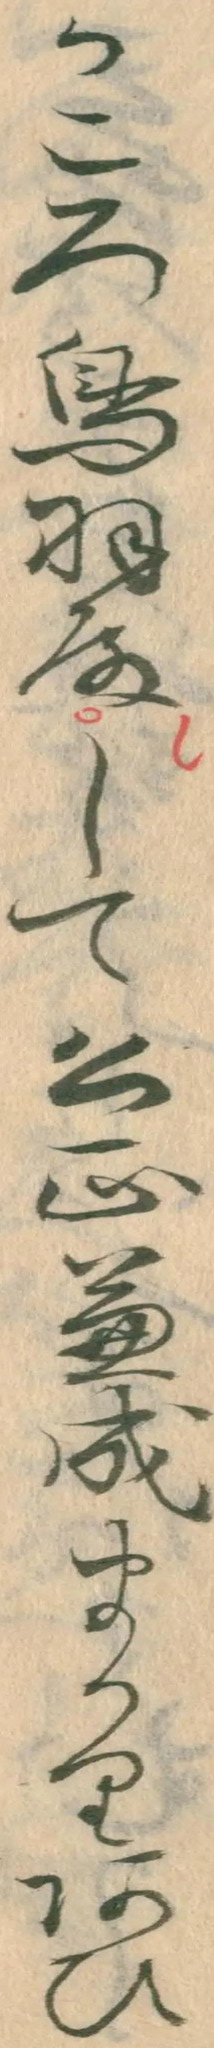かころ鳥羽殿◦して公正兼成まかりあひ
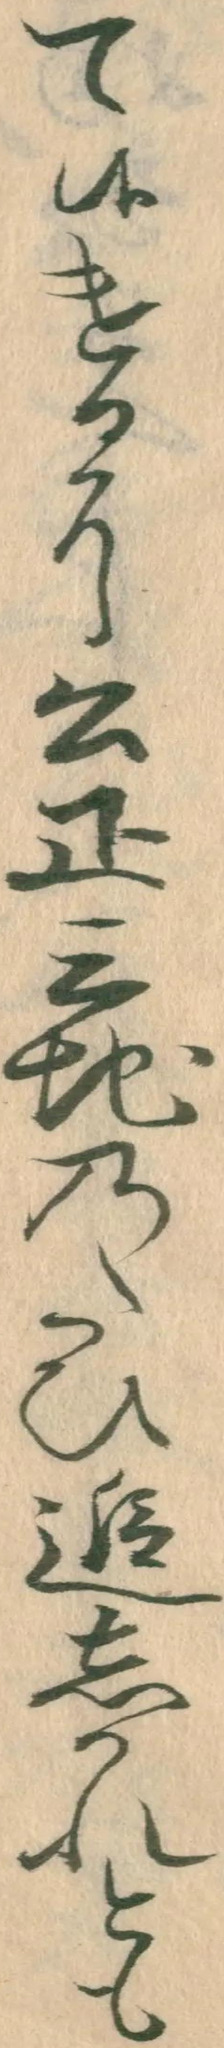て候けるに公正三地のたひ追しかれとも
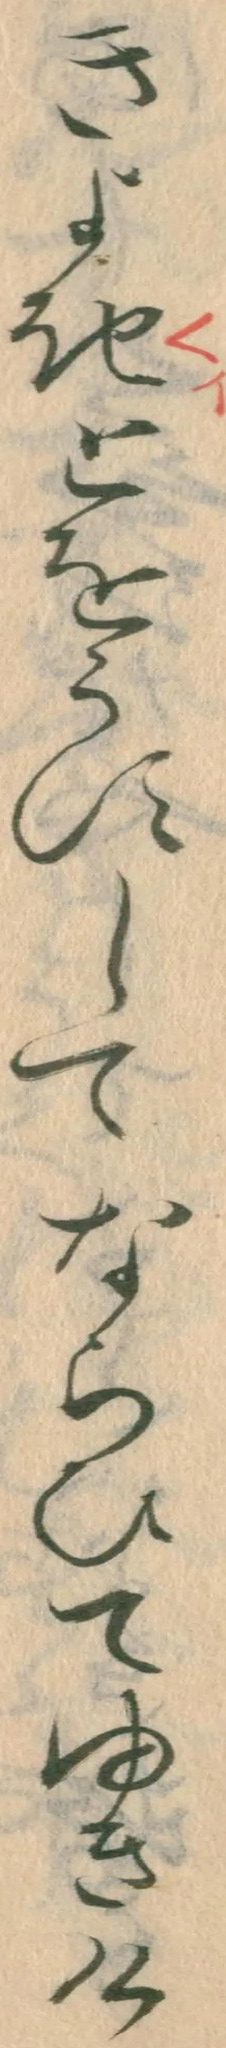きよきとをうすしてならひてゆきけ
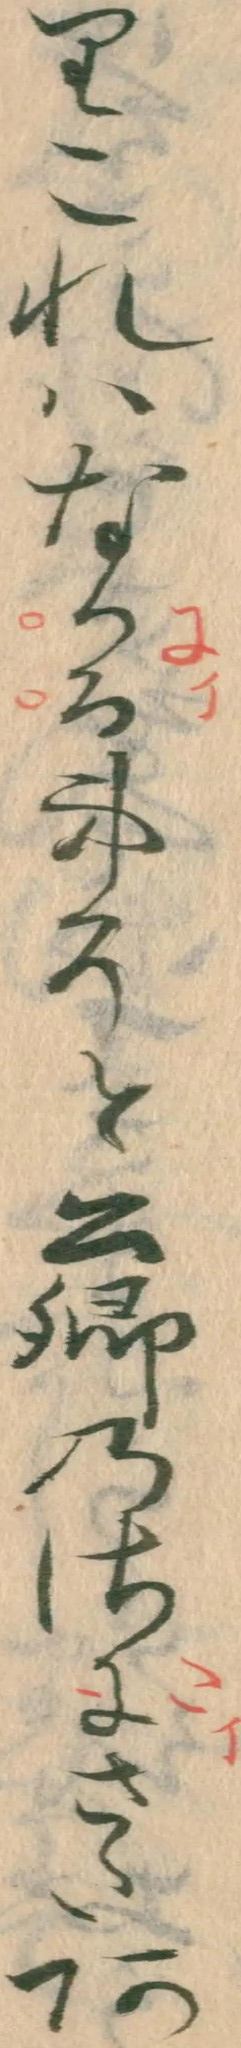りこれはなかる事そと公卿のさにさたあ
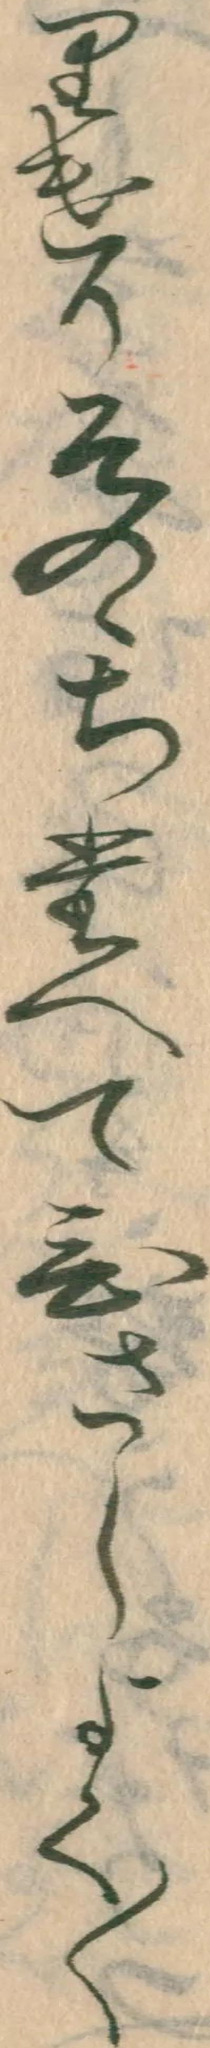りけりそのゝちたへてひさしよく〳〵
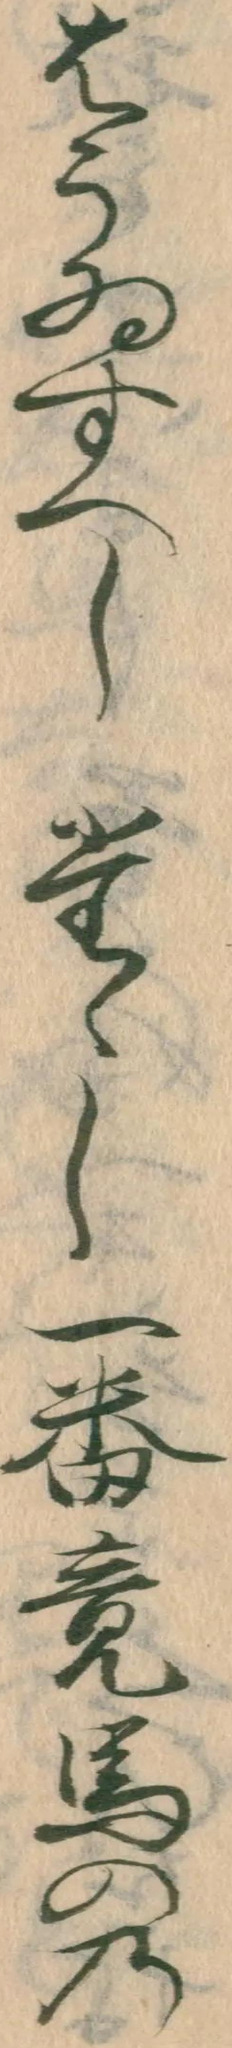はうゐすへしたゝし一番竟馬のの
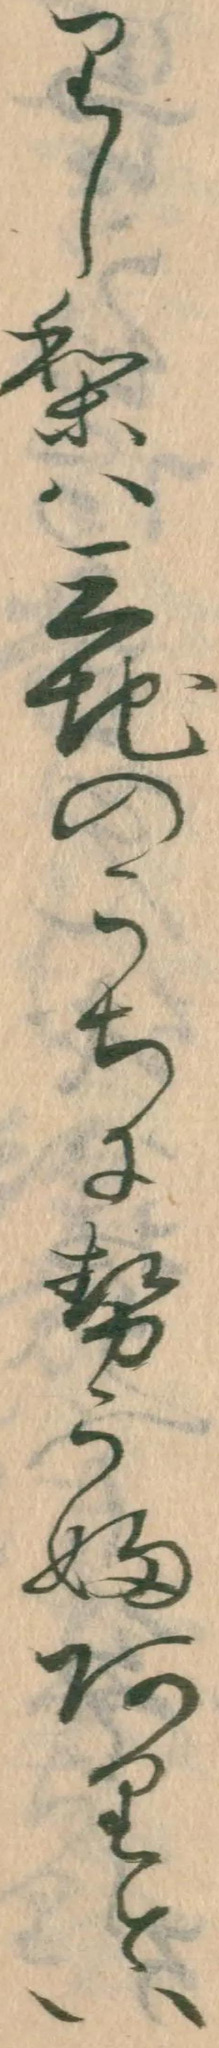りしりは三地のうちにせうふありとい
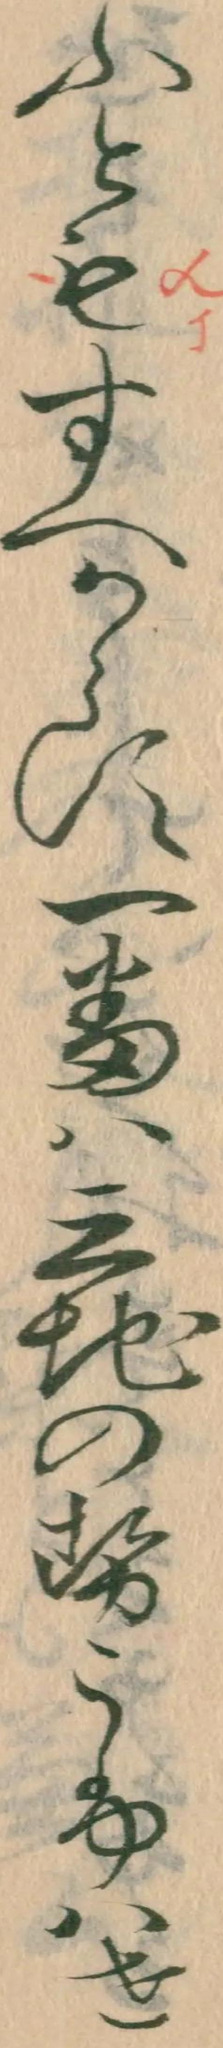ふともすへからす一番は三地の勢うふはせ
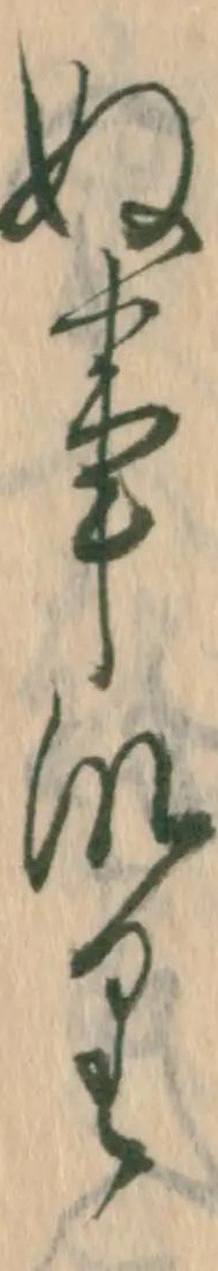ぬ事なり
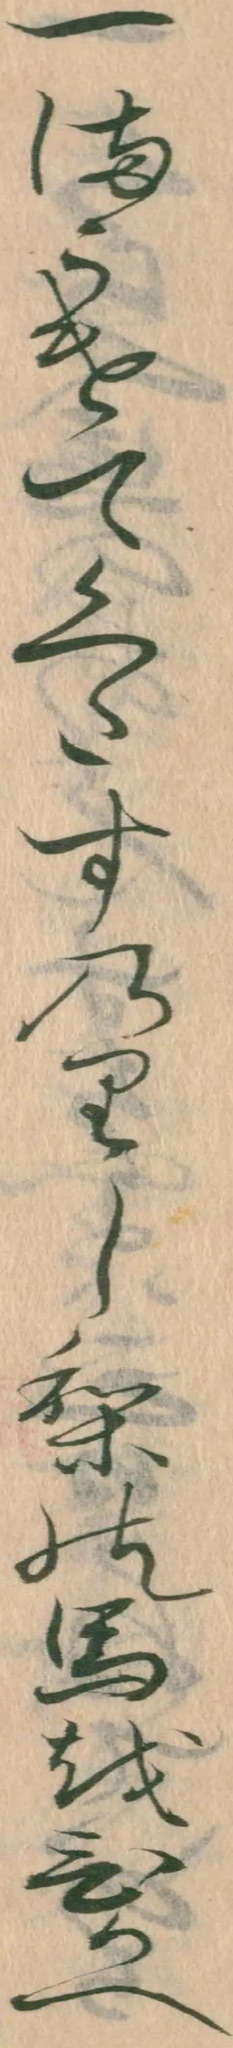一まうけてくたすのりしりの馬をひかへ
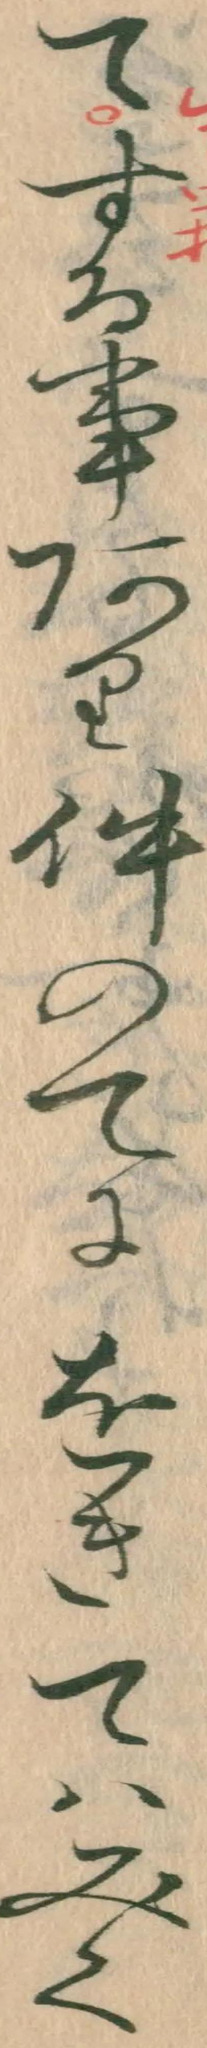て◦する事あり件のてにをきてはみく
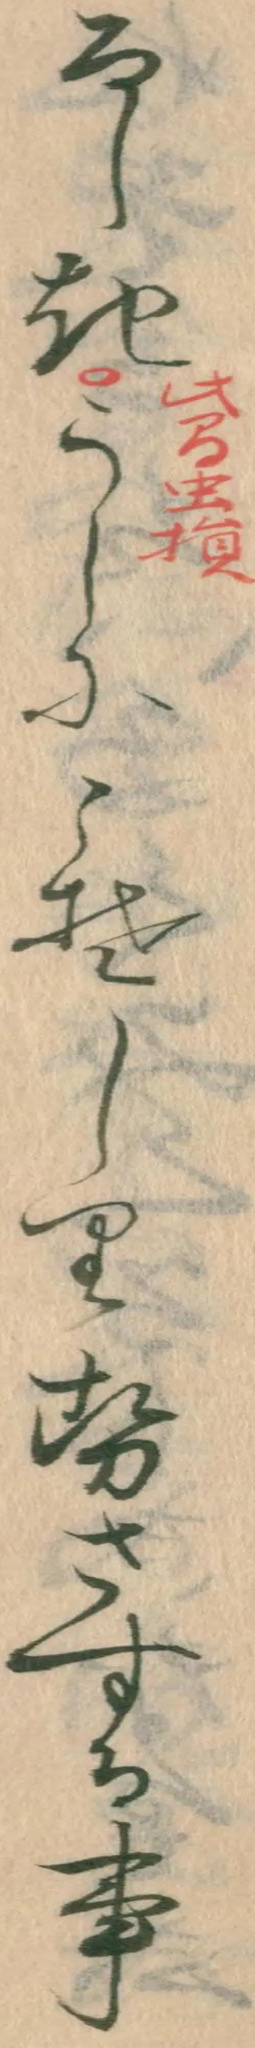るしき◦うしにこそしりせさする事
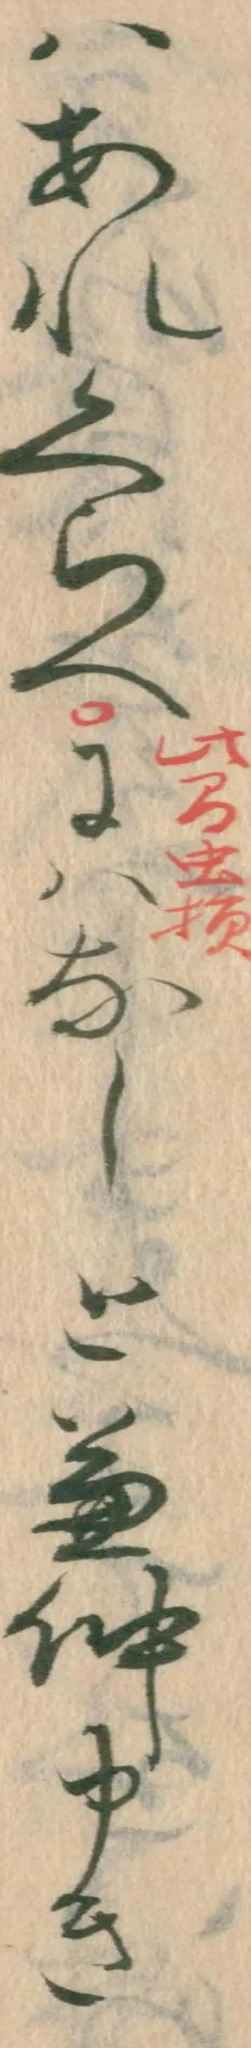はあれくらへ◦にはなしと兼仲申き
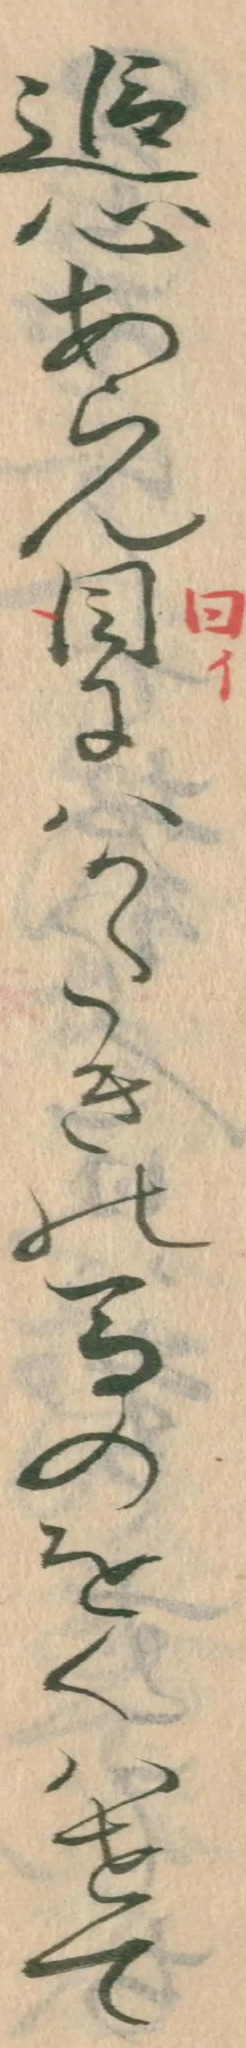一追心あらん目にはかたきの馬のをくはせて
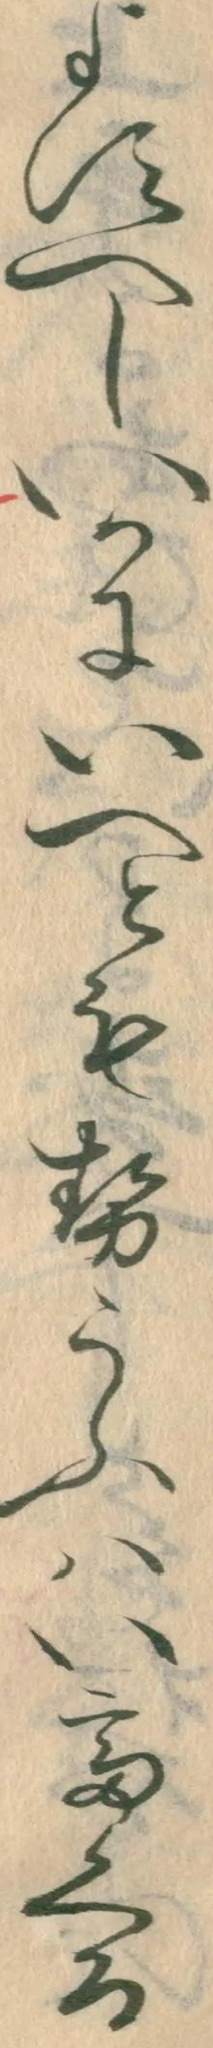よすへしいかにいへともせうふはいてくる
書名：賀茂社記録. 第13冊
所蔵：国立国会図書館 National Diet Library, JAPAN
